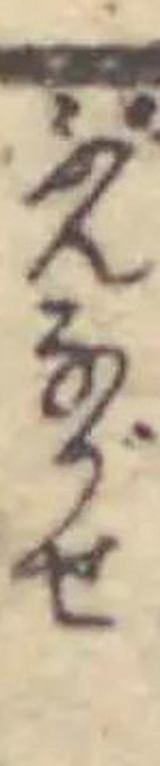ぶんながせ
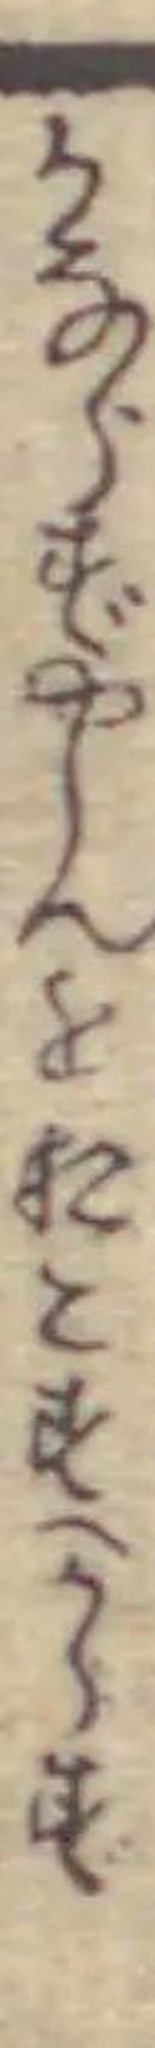かならずやしんをおこすへからす
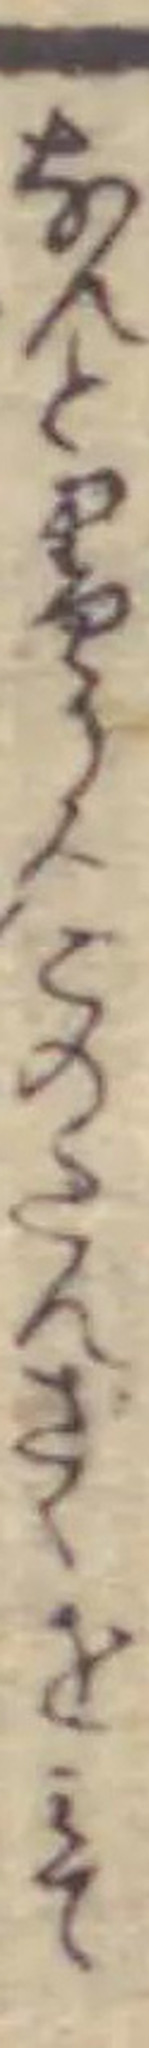なんとりやう人このたんざくをみて
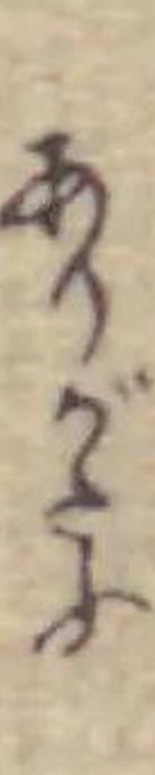ありがとふ
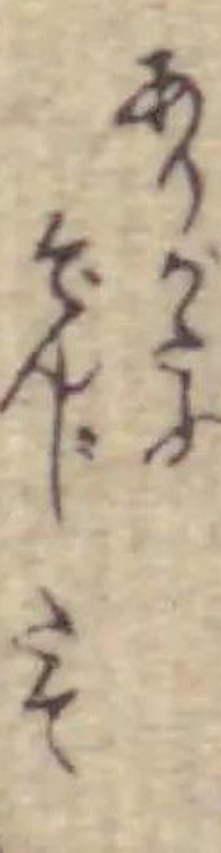ぞんじたて
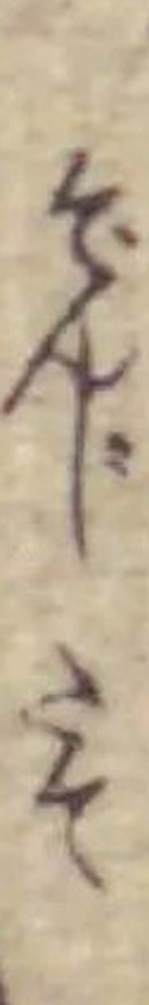ぞんじたて
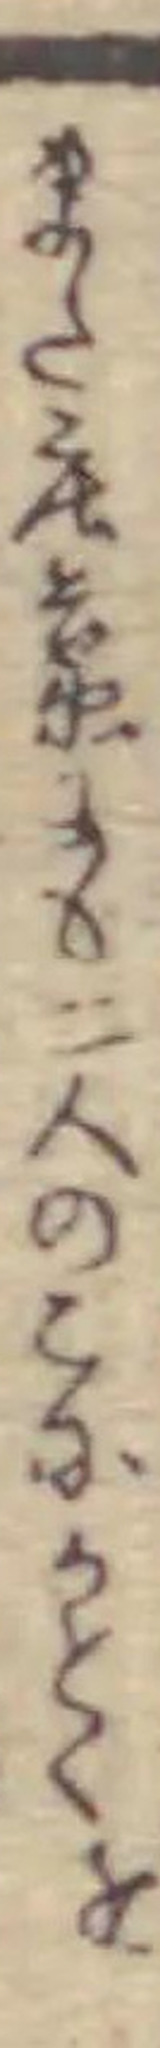また庄兵衛にも二人のこにかとくを
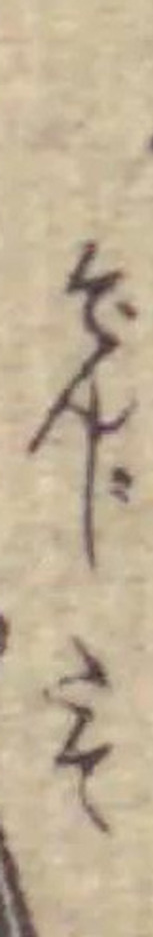ぞんじたて
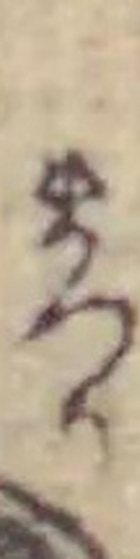まつり
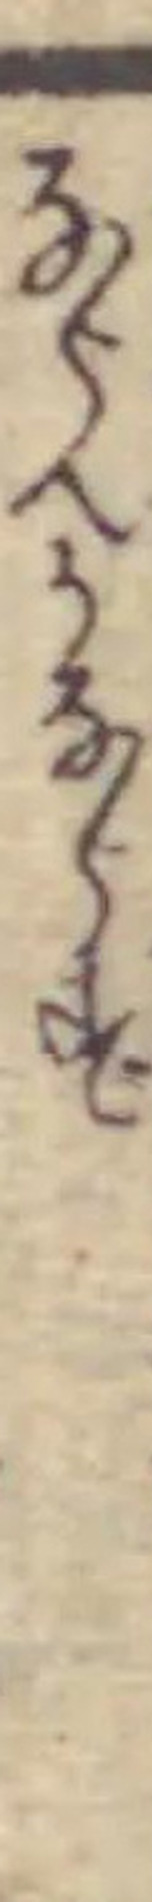ならんかならず
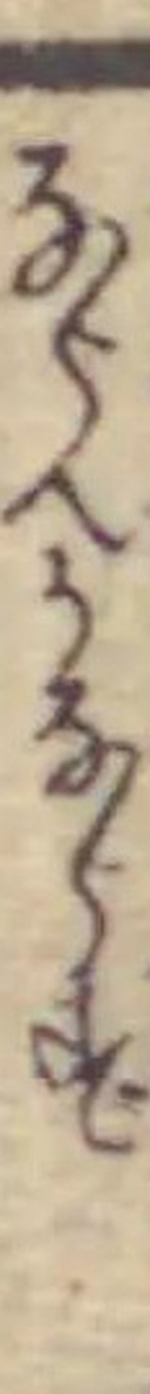ならんかならず
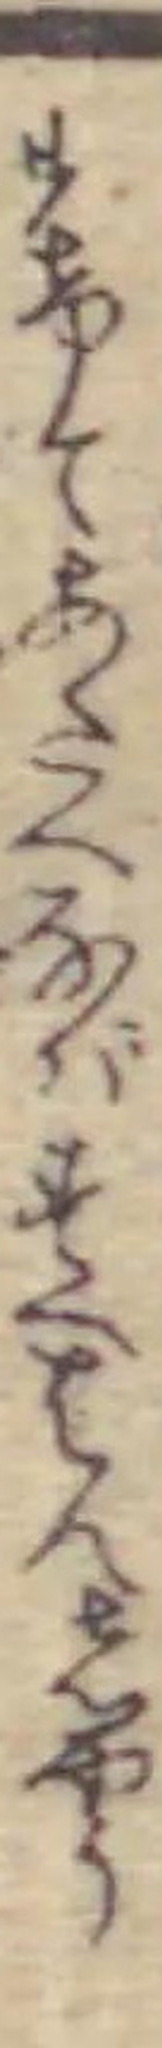わけてあたへなばすへはんしやう
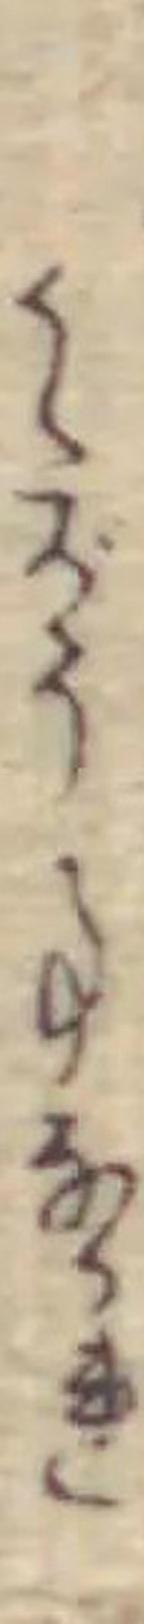うたがう事なかれ
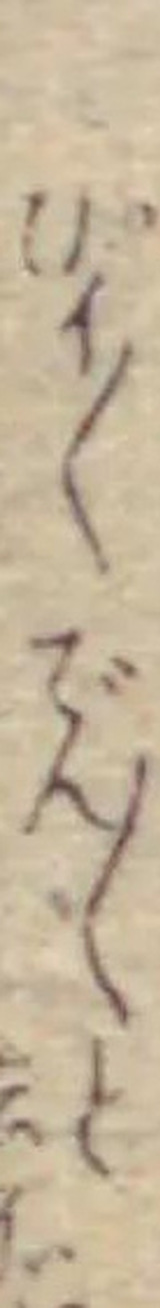ぴイ〳〵でん〳〵と

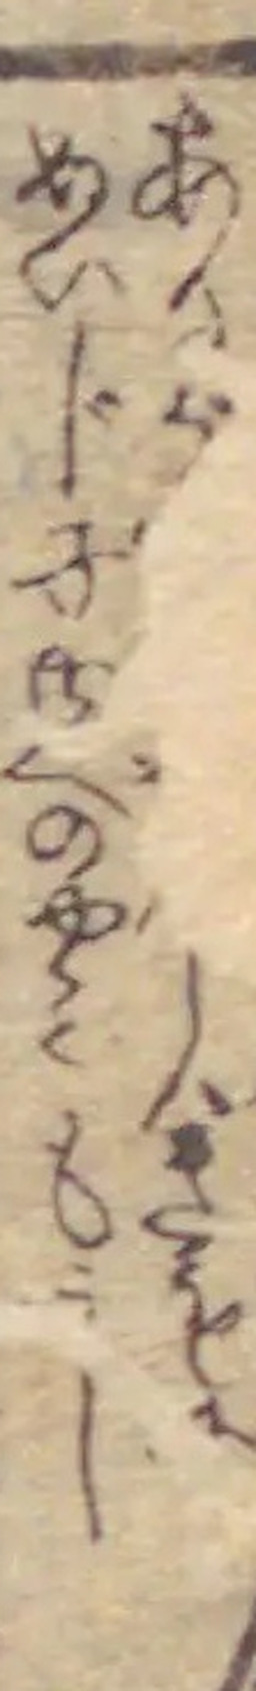めいじ子ゆへのやみもし
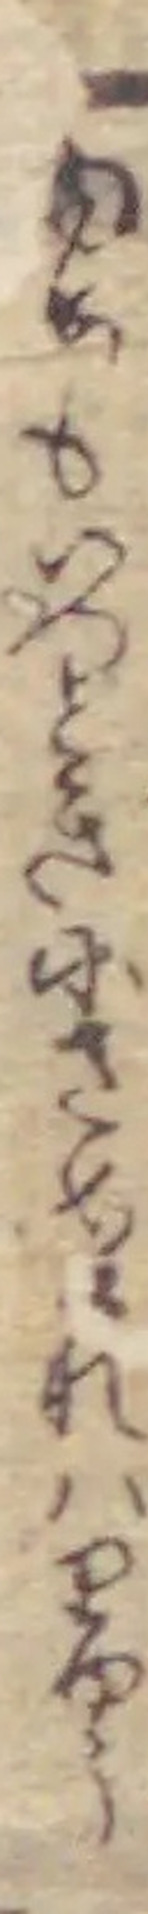ゆめもいつときにさめにけれはりやう
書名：餅酒腹中能同志 2巻
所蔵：国立国会図書館 National Diet Library, JAPAN
